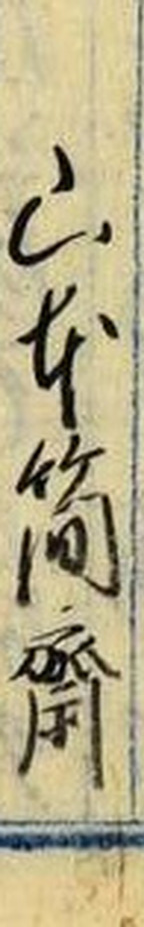山本簡齋
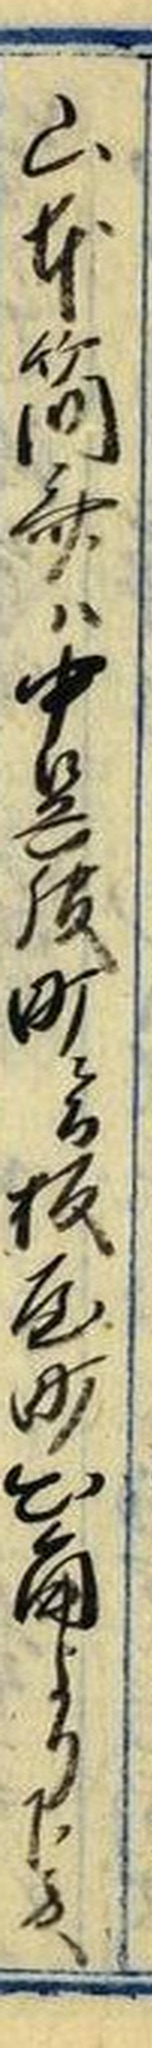山本簡齋は中呉服町に而板屋町出角より下方へ
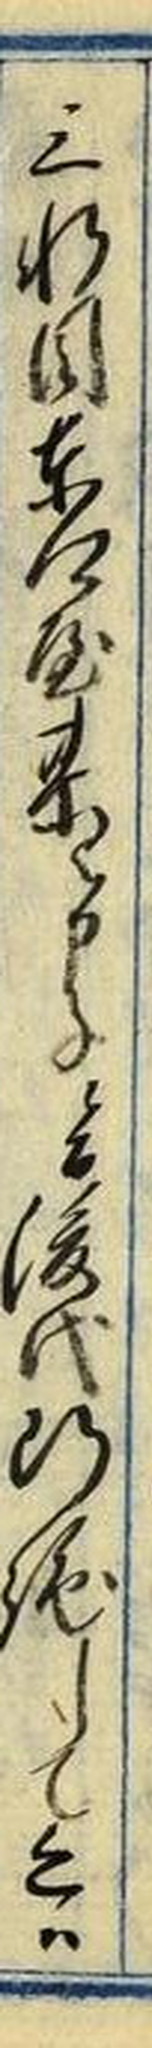三軒目東郷屋某と申子に而後代断絶して今は
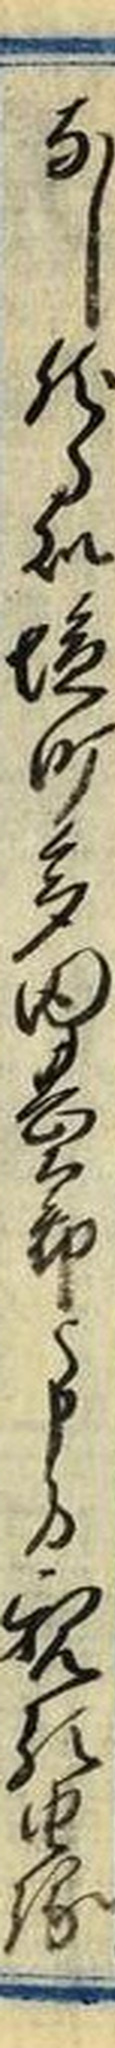なし然る処塩町多田甚太郎と申方親類由縁
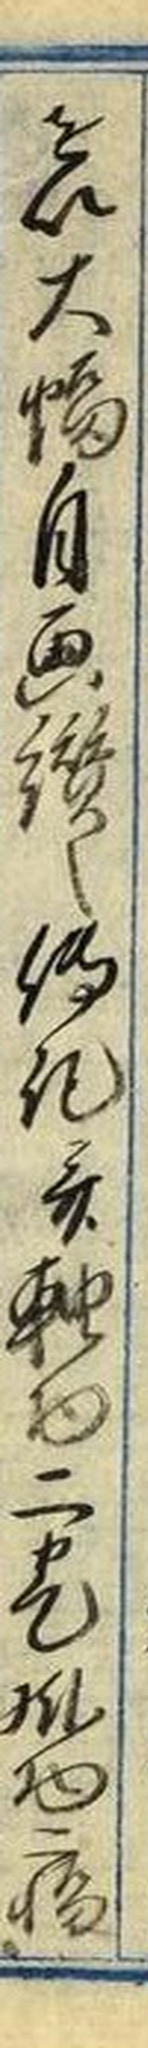を以大幅自画讃之伝記并軸物二巻掛物二幅
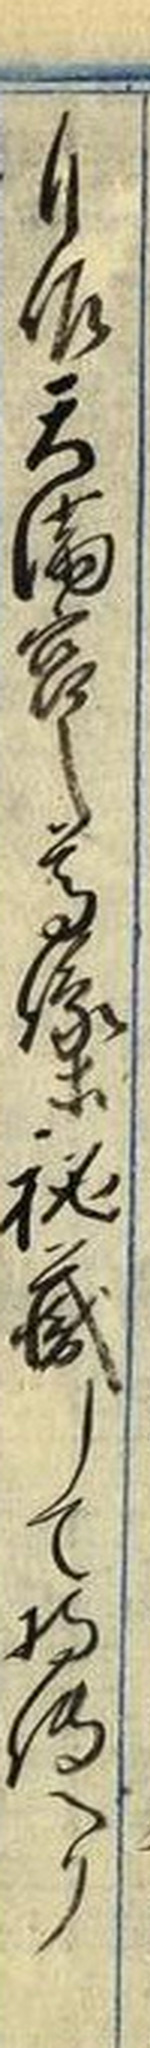自作天満宮之尊像等秘蔵して持伝へり
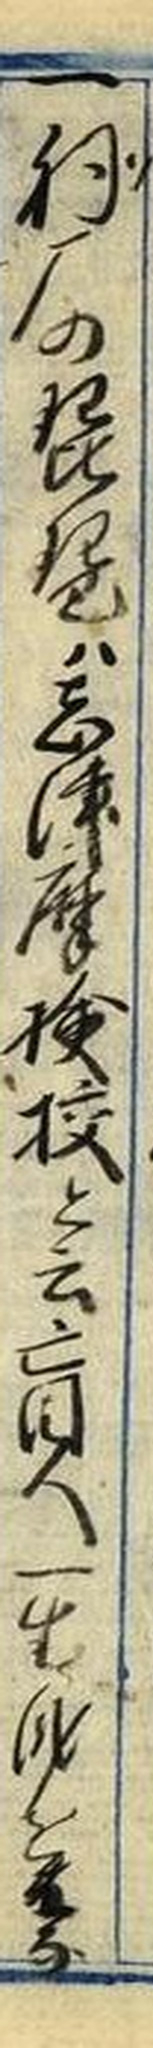一利歴の琵琶は甚津摩検校と云盲人一生身をはな
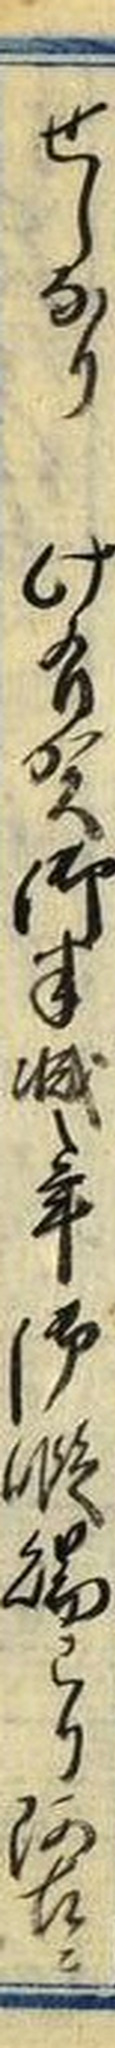せしなり此有賀御半減之年御暇賜わり阿古に

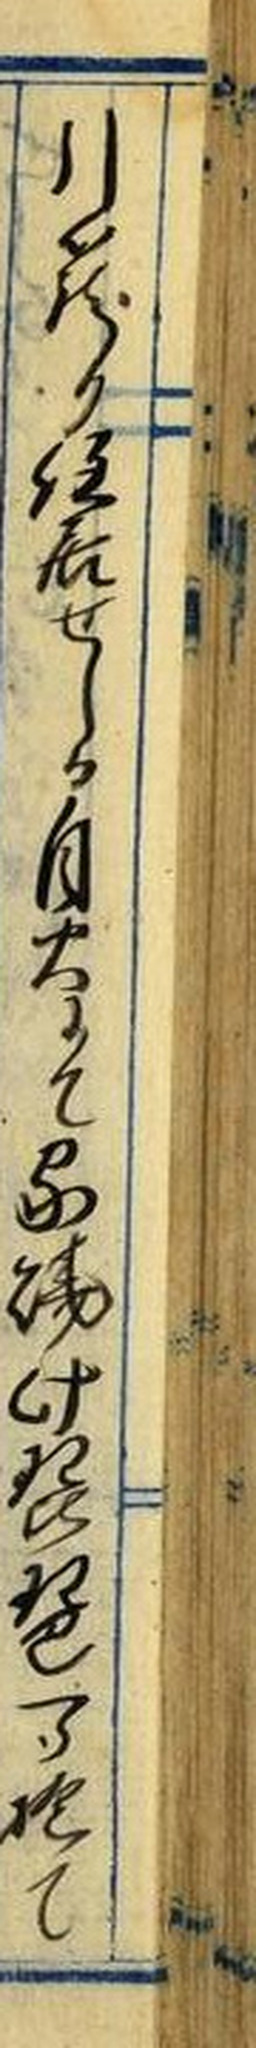引籠り住居せしか自火にて家焼此琵琶一ッ抱て
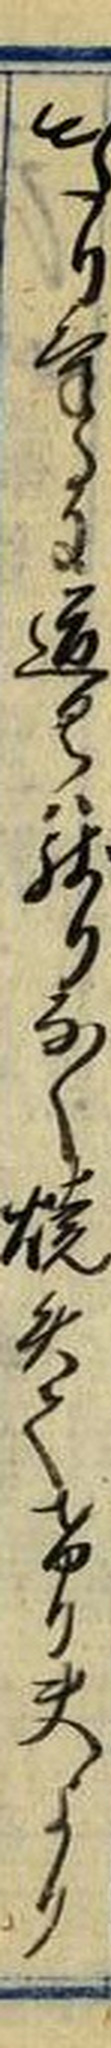出たりけるに道具は残りなく焼失てけり夫より
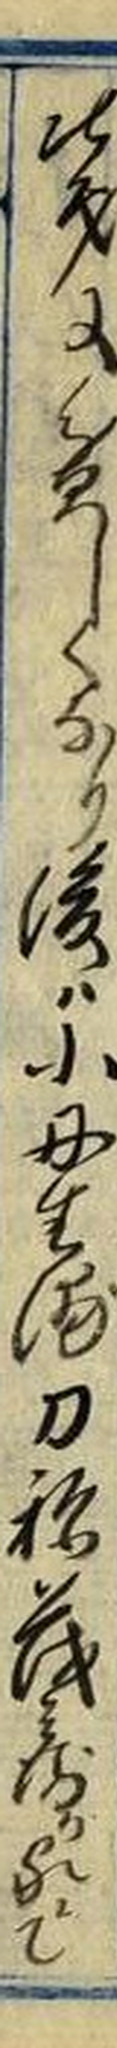次第に貧しくなり後は小丹生浦刀祢茂兵衛が家にて
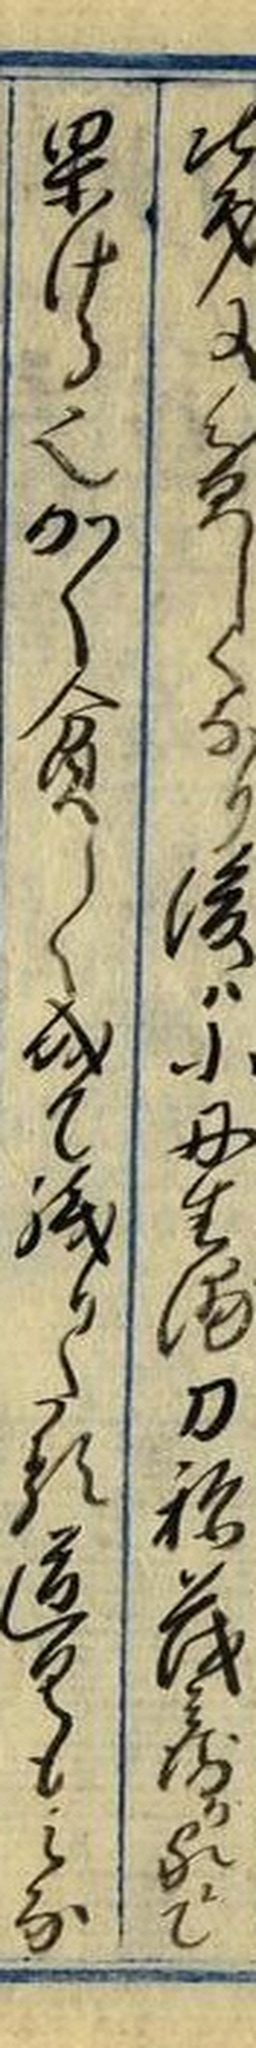果ける也かく貧しく成て残りたる道具もみな
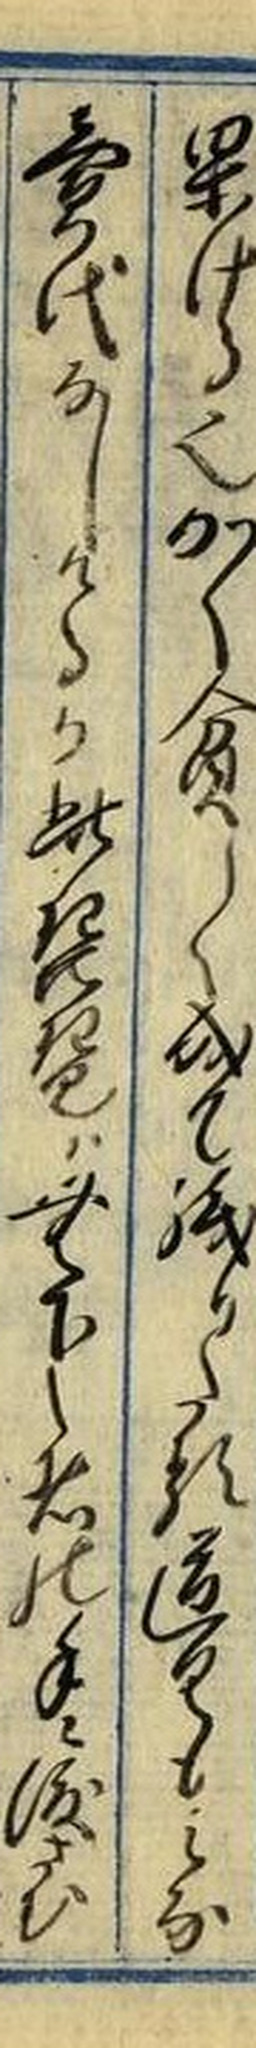売代なしけるが此琵琶は無下之者の手に渡さむも
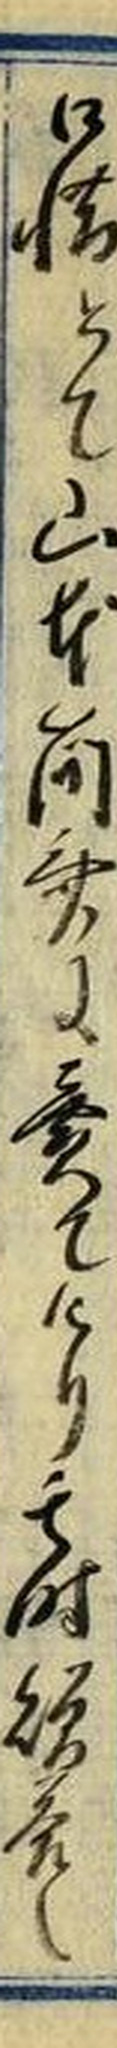口惜とて山本簡齋に売てけり其時贈答之
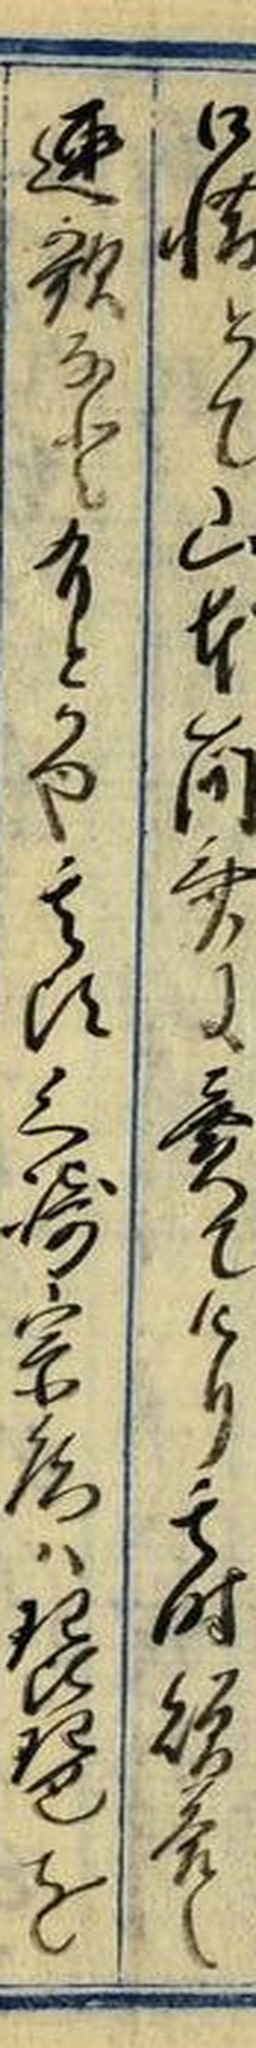連歌なと有とかや其頃三崎宗庵は琵琶を
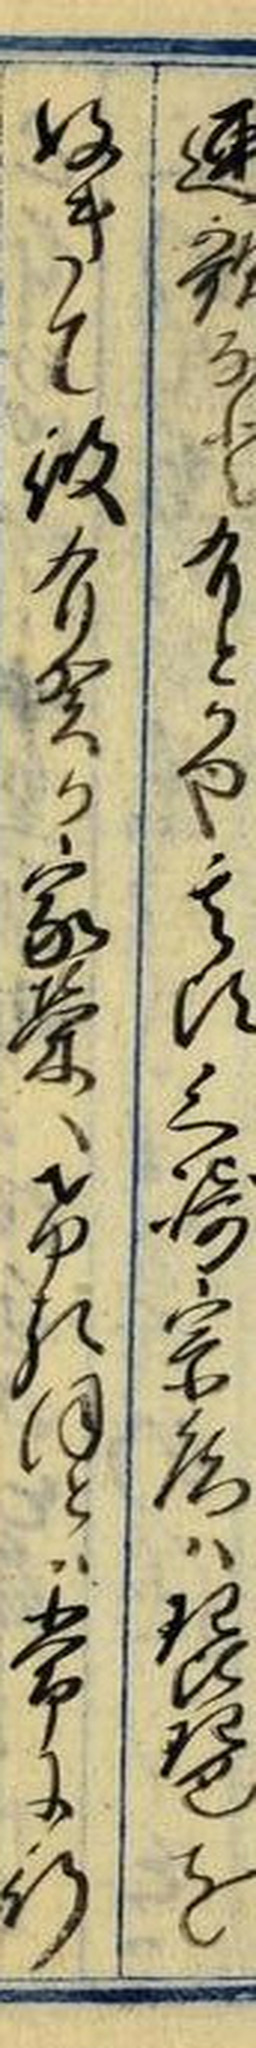好きて彼有賀か家栄へけるほとは常に行
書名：温古集 四巻
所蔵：福井県文書館 Fukui Prefectural Archives
